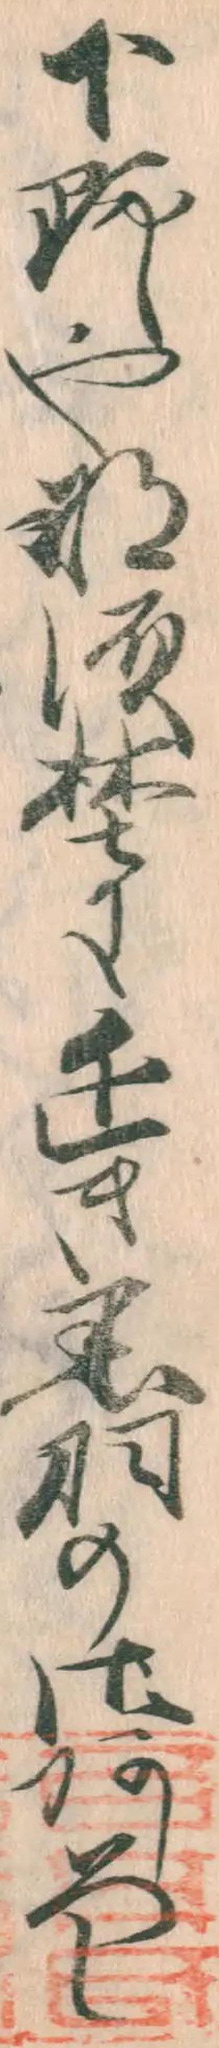下野や那須野に近き黒羽の御あしろし
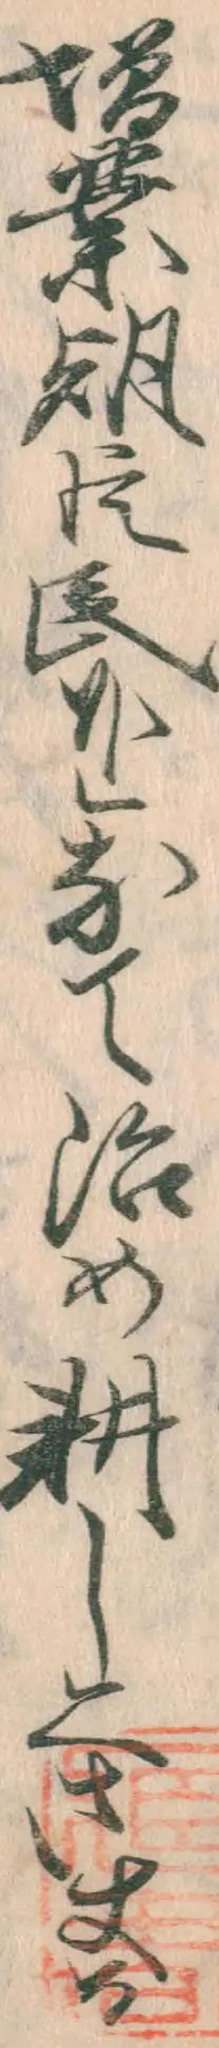増業朝臣民をなて治め耕しくさきる
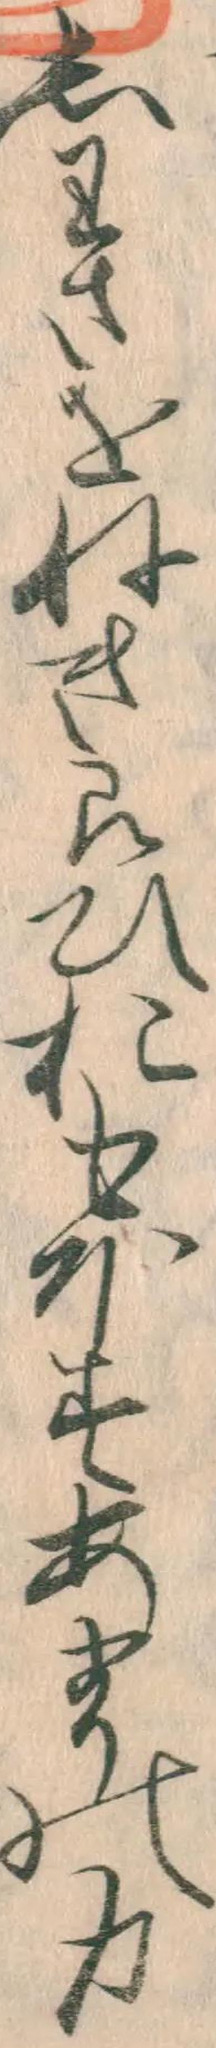しわさをねきらひおもほすあまりの力
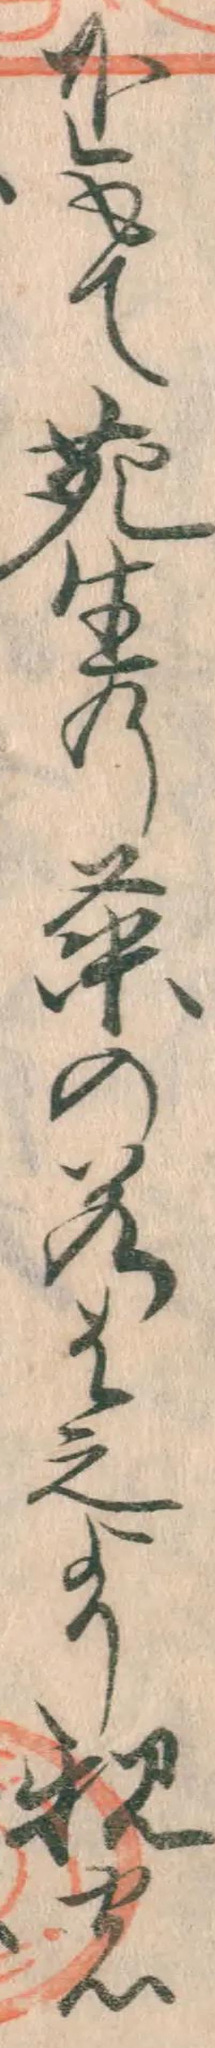をもて苑生の桑の若はえより親の
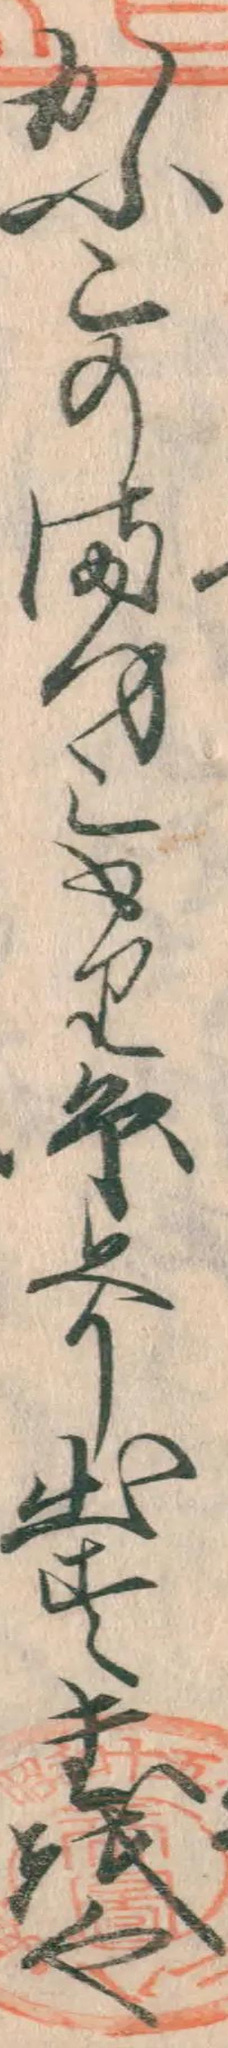かふこのまゆこもり糸くり出すたをや
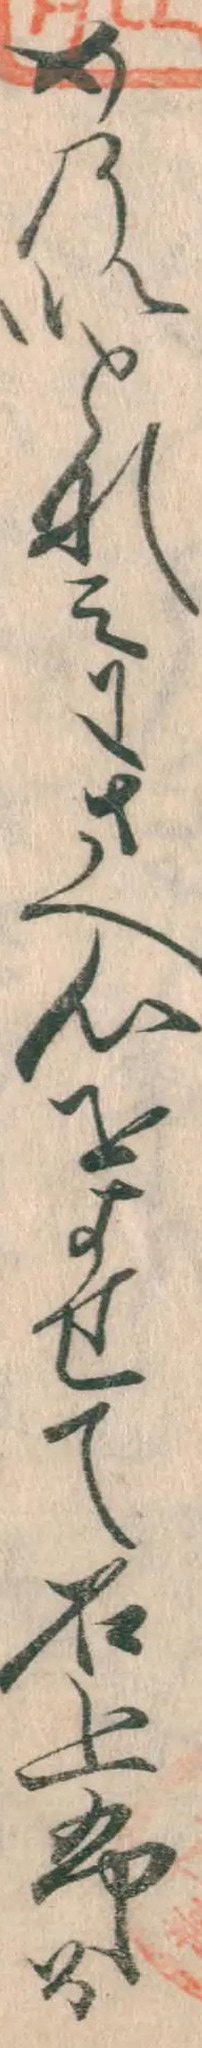めのいとなみにさへ心をよせて石上ふる
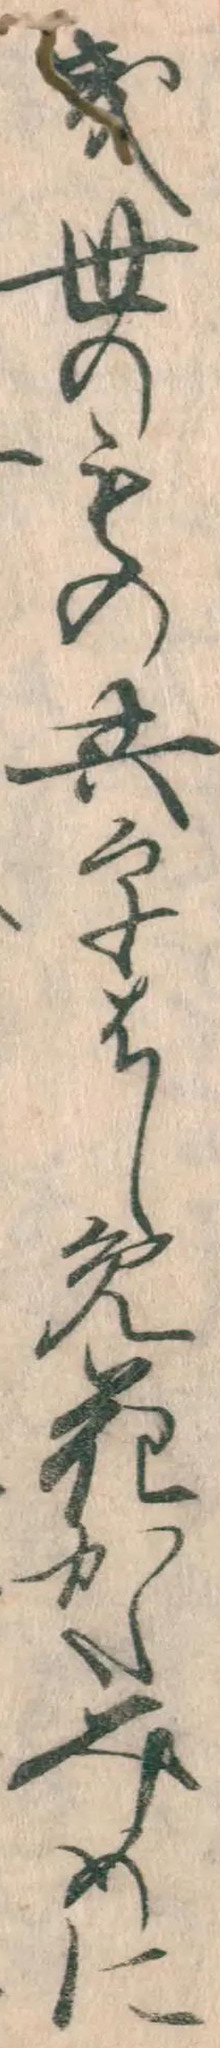き世のもの共をはしめ花かたみめに
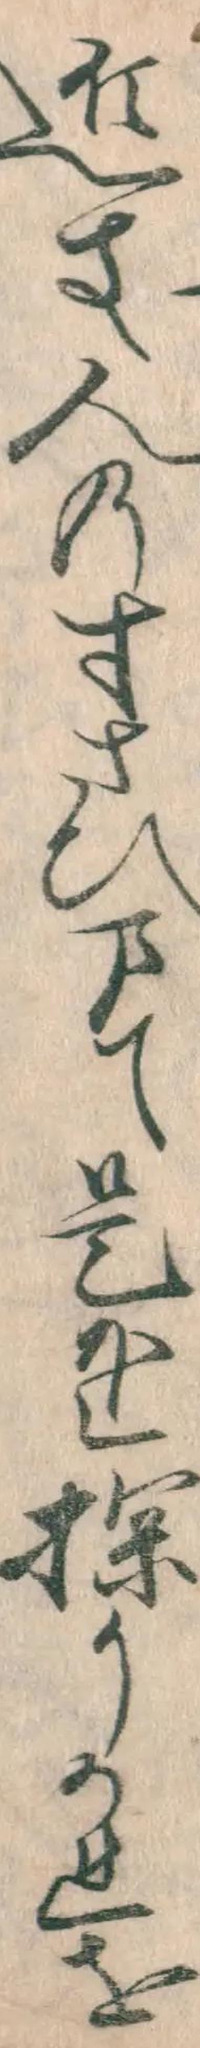近き人のすさひまて是を探りかれを
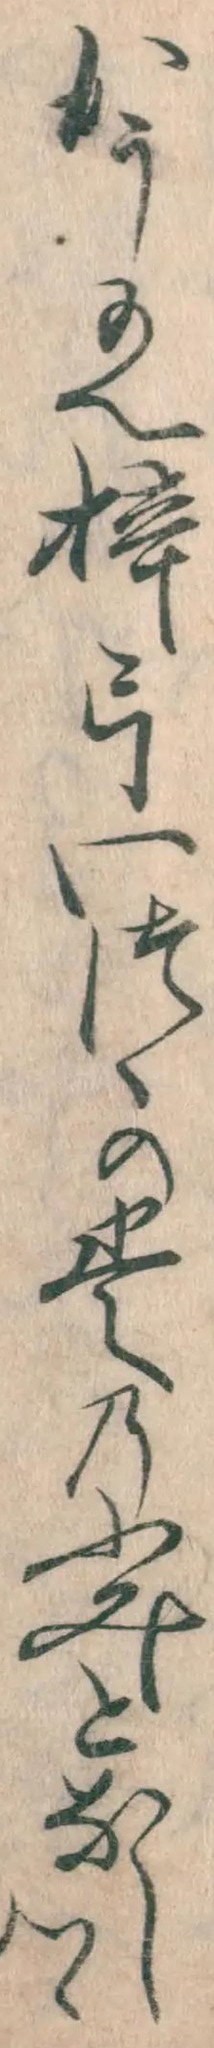かうかへ梓弓いつゝの巻のふみとなしつゝ

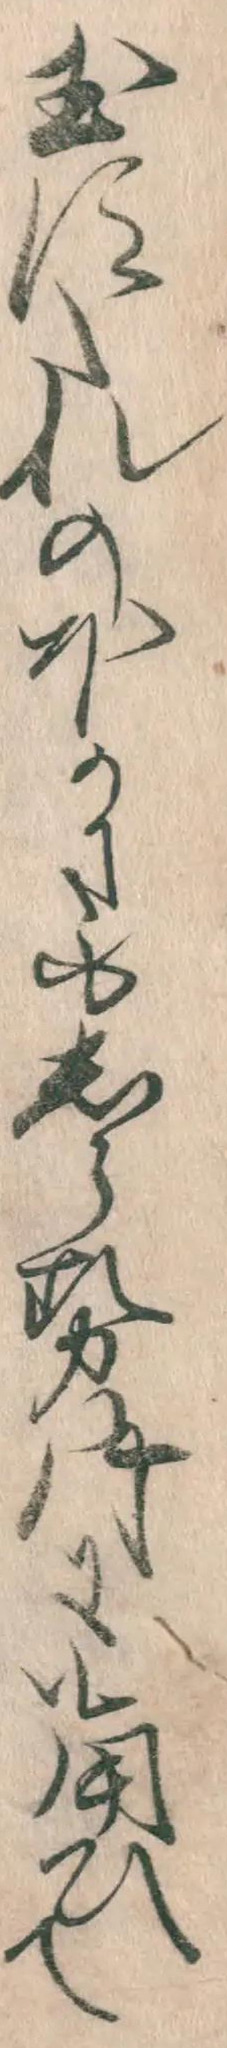玉すたれのほかにもしらせ内にも用ひて
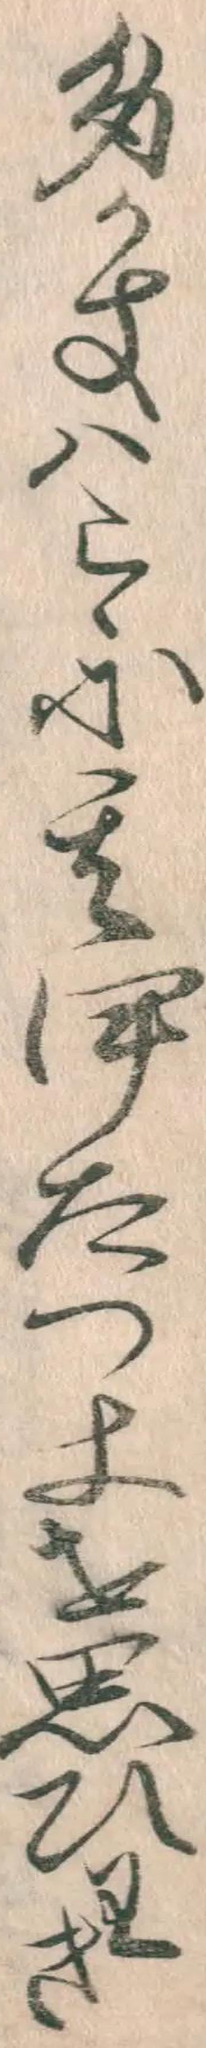たかきはこゝに其いたつきを思ひわき
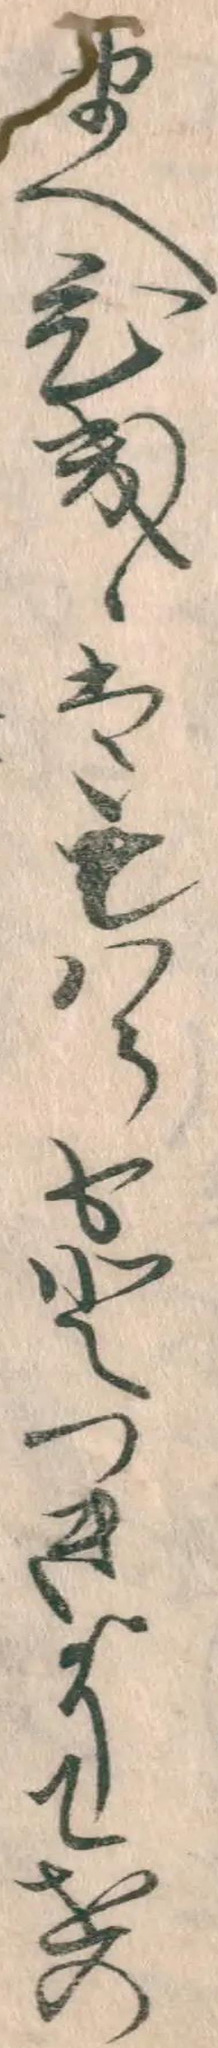まへひきゝはもはらもとつきよりてをの
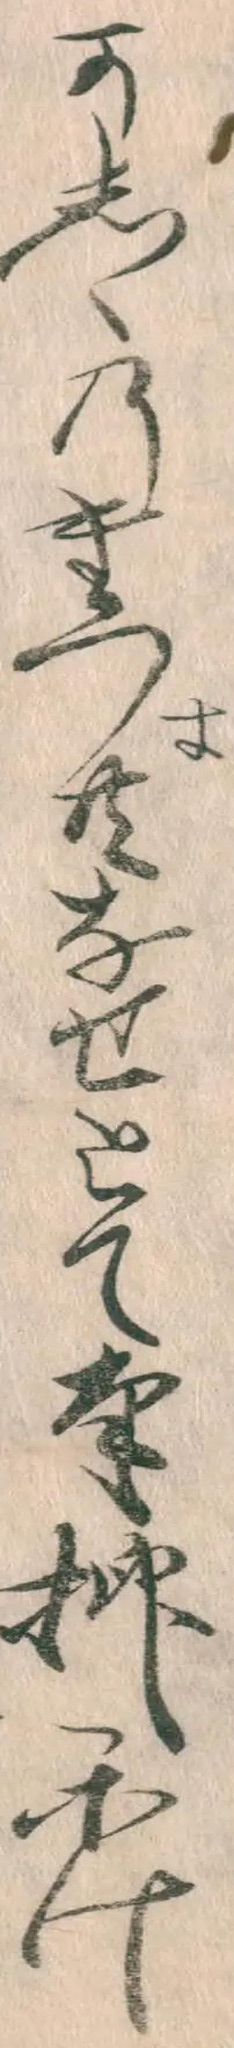かしゝのたつき共なせとて南抑かけ
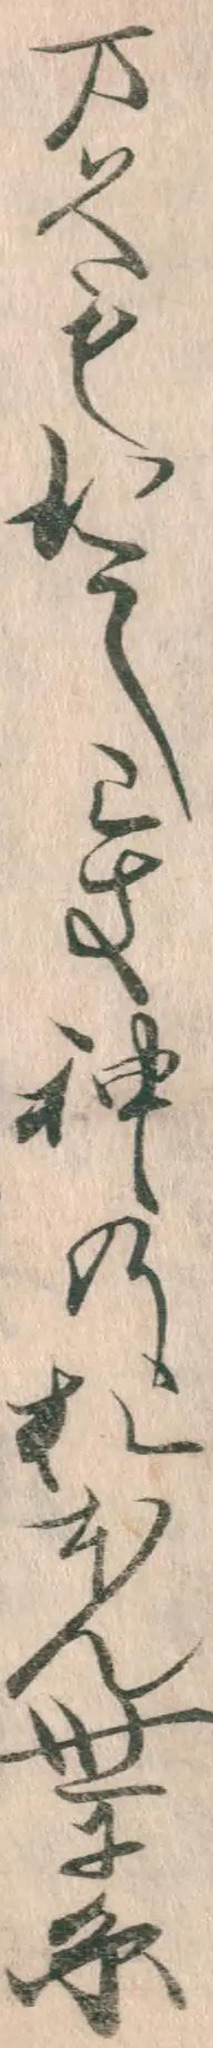まくもかしこき神のおほん世に糸
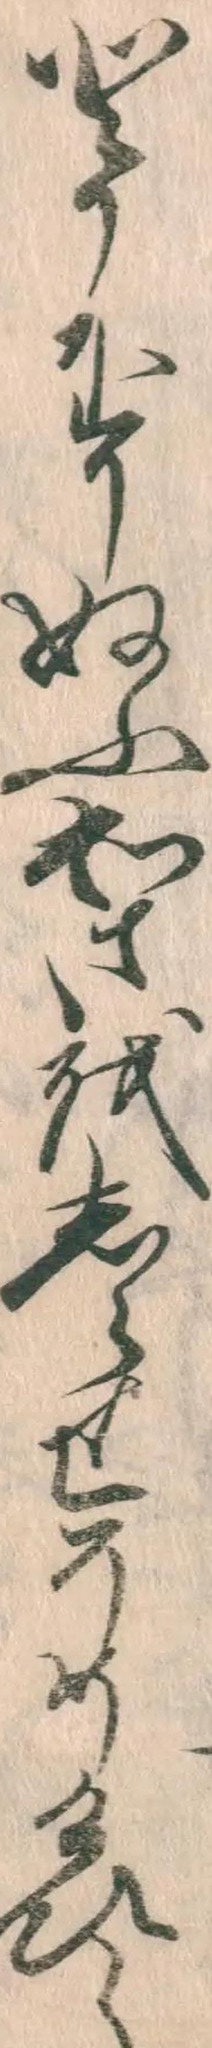とりをりぬふわさをしらせそめ給ひし
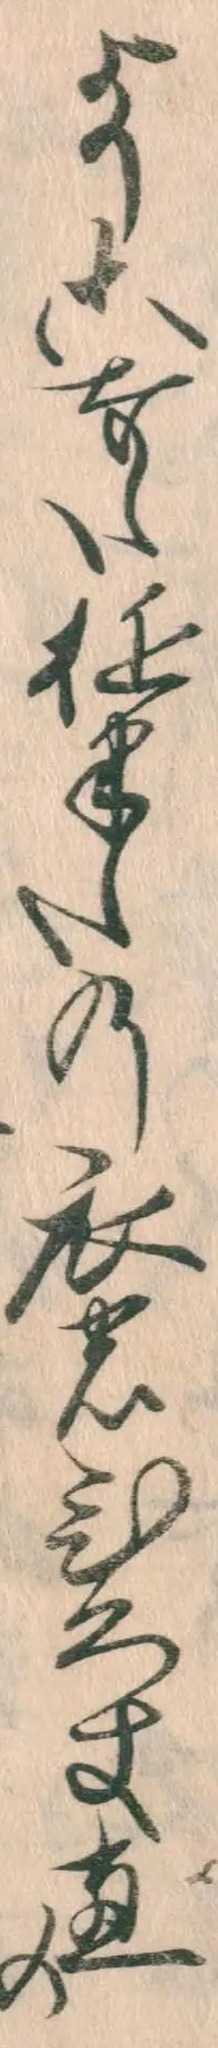よりこなたゆはたの衣のひろき恵の
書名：機織彙編 5巻. [1]
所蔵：国立国会図書館 National Diet Library, JAPAN
